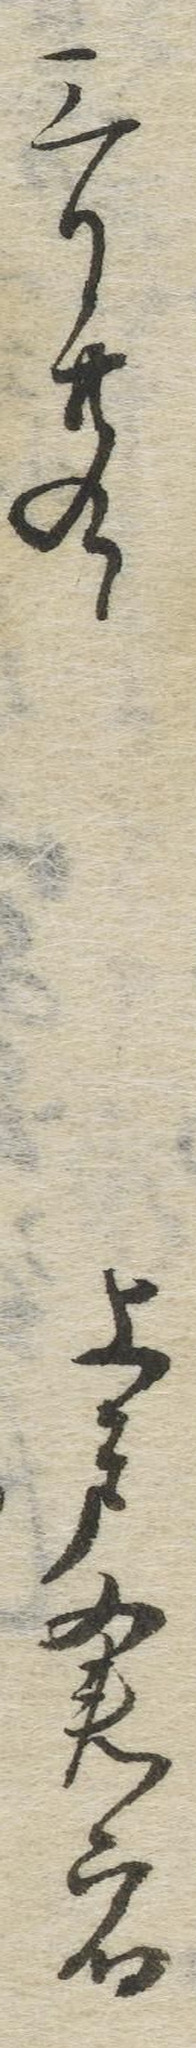三月廿九日上戸倉宿
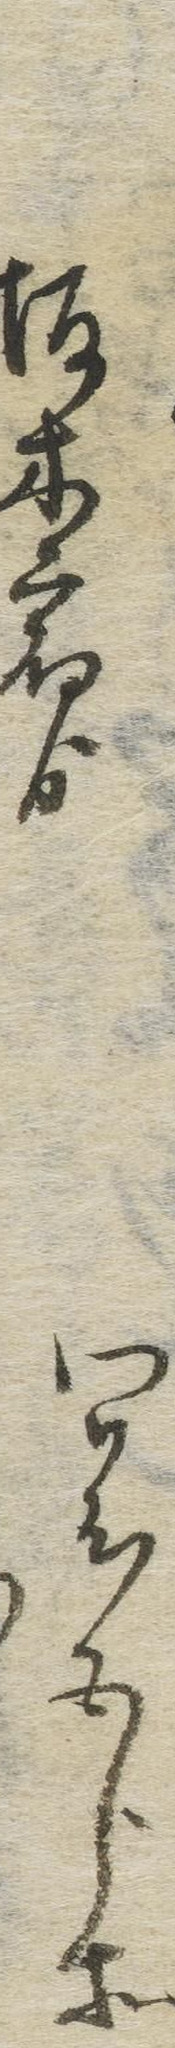坂木宿ゟ問屋五郎兵衛
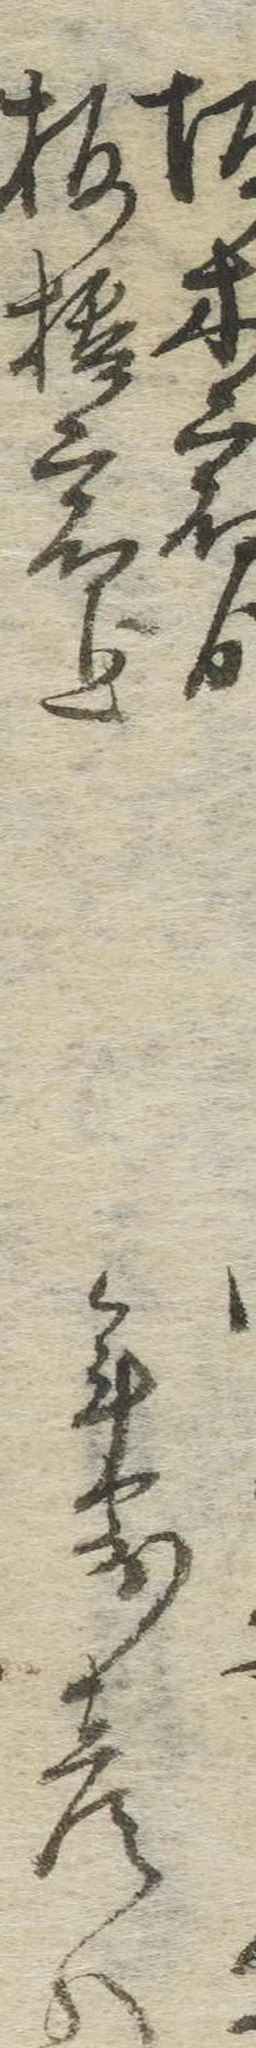板橋宿迄年寄彦八
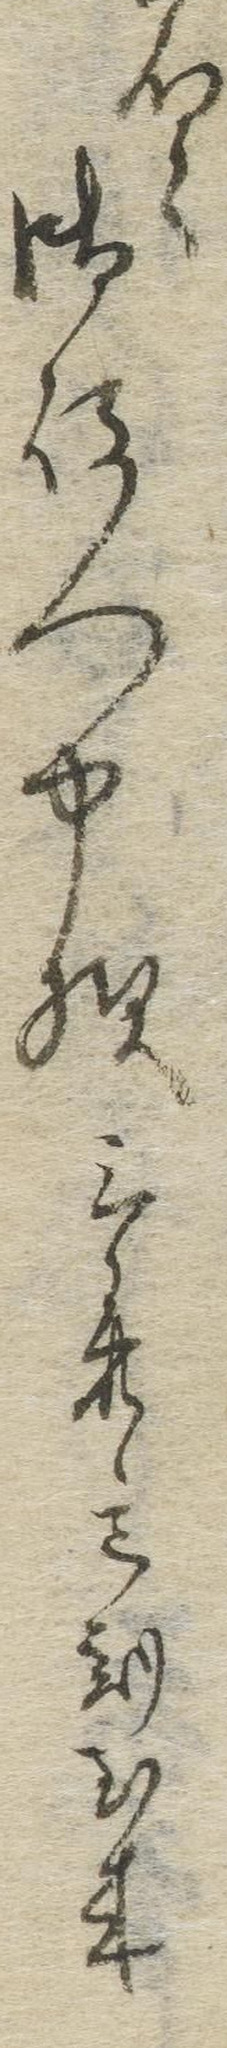御役人中様三共巳刻到来

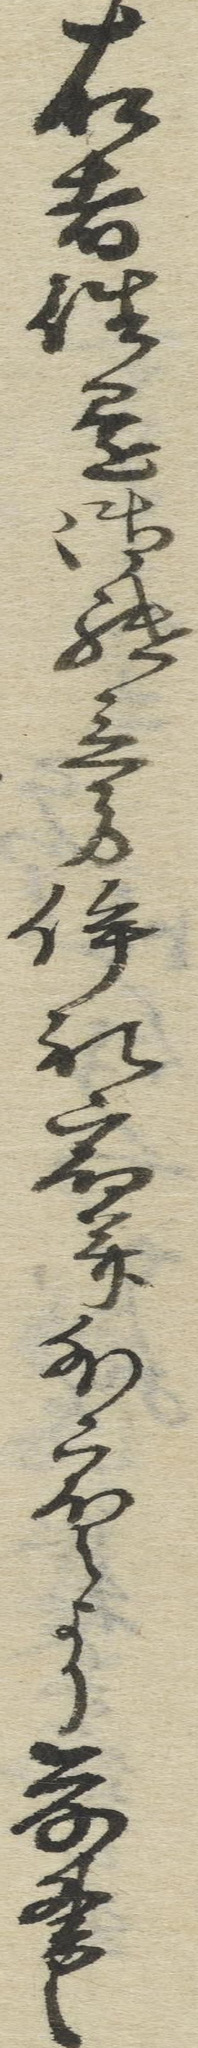右は往還御継立方侔礼宿并外宿より前書之
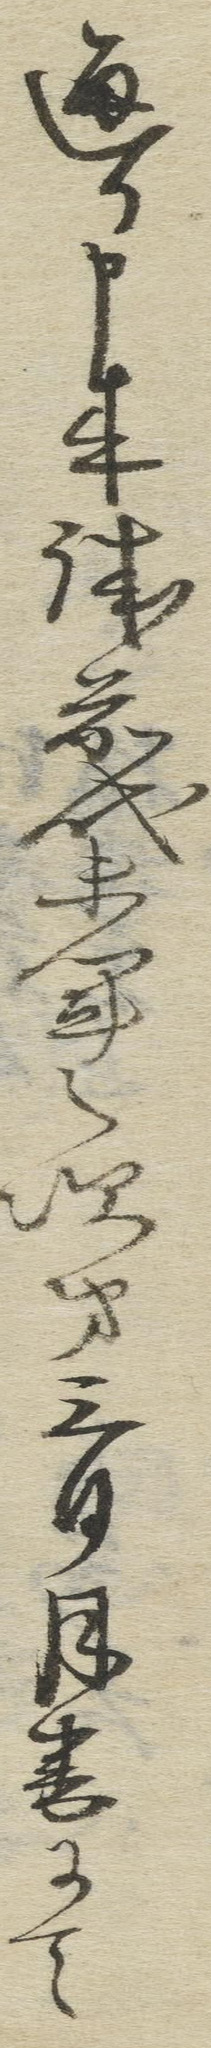通り申来り誠前代未聞之次第三月月番にて
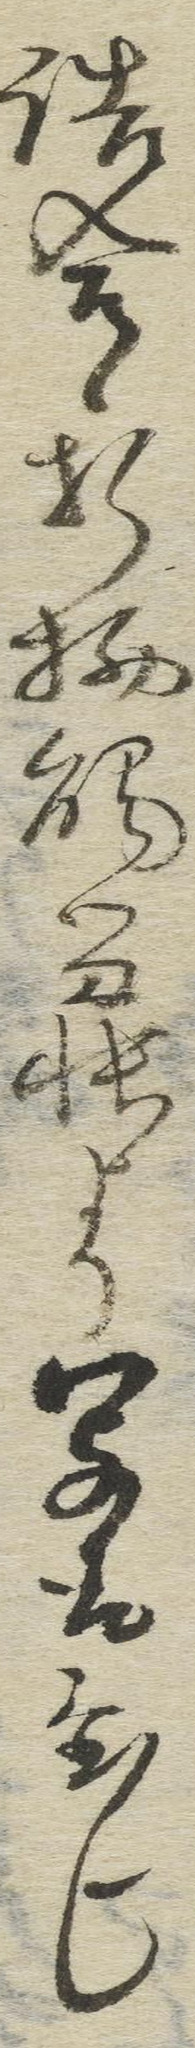詰会候折柄觸留状より写取置申候
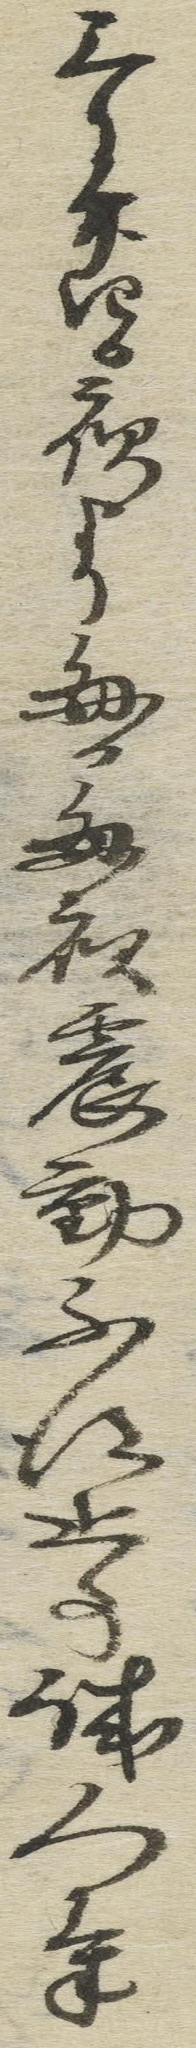三月廿四日夜より毎日多夜震動不得止事誠人気
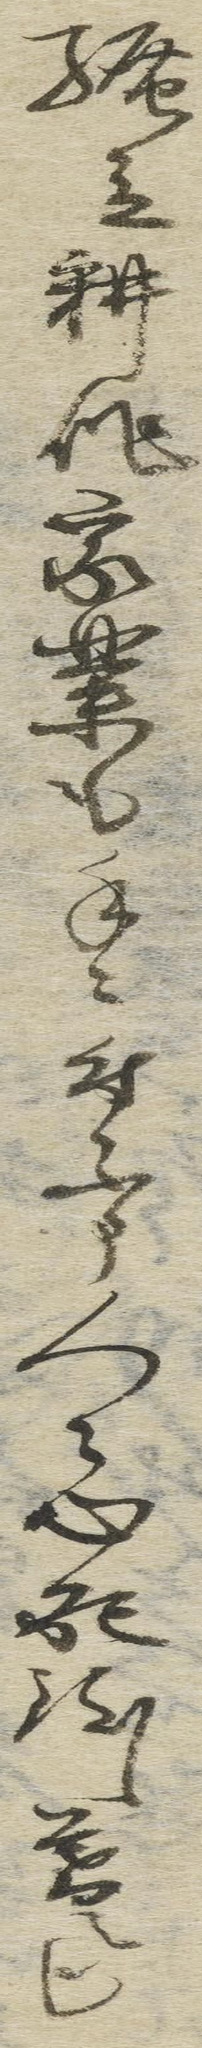騒立耕作家業も手二付不申人々心配致し暮し申候
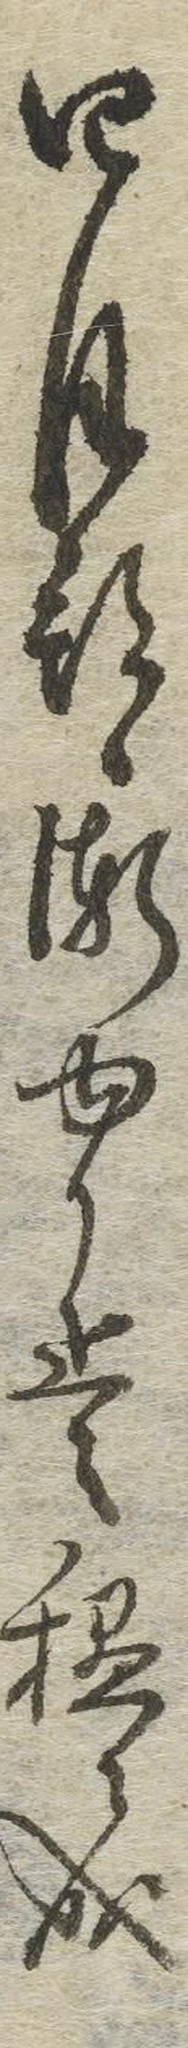四月朔日漸ゆり止り候穏二成
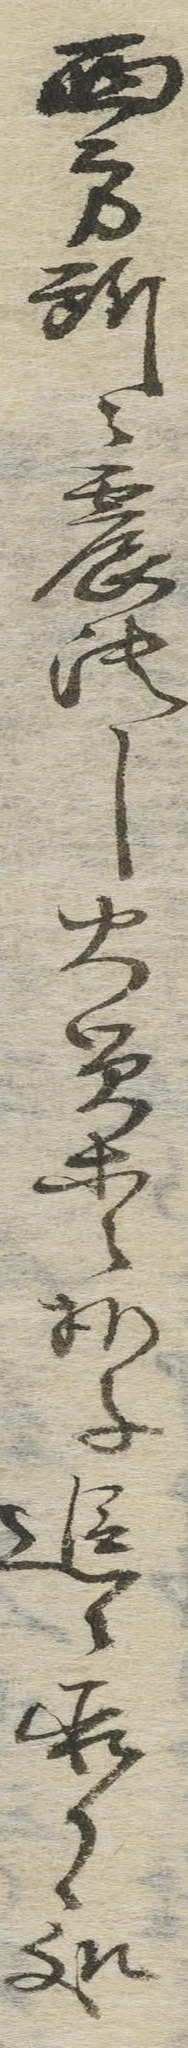西方所々震潰し火災等之様子追々承候処
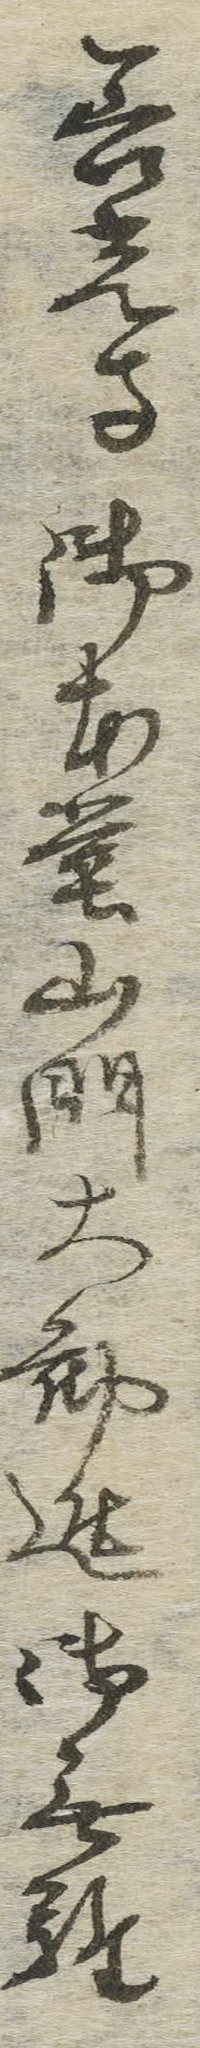善光寺御本堂山門大勧進御無難
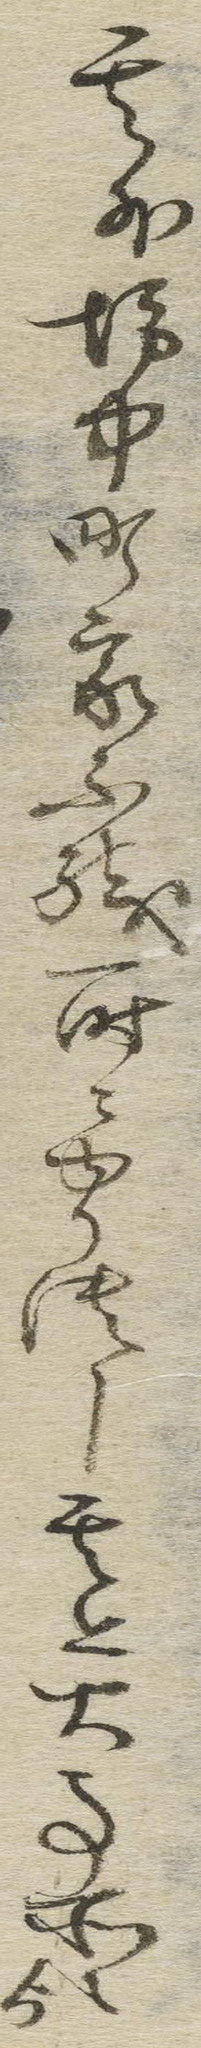其外坊中町家不残一時二ゆり潰し其上火事所々ゟ
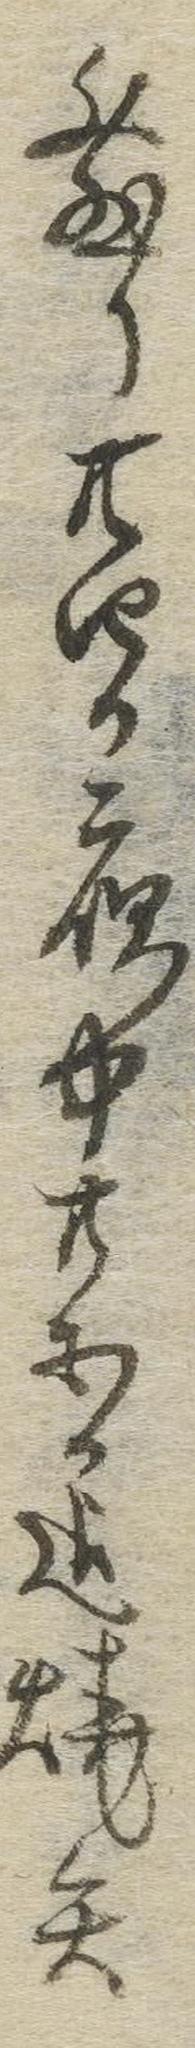発り廿四日夜中廿五日迄焼失
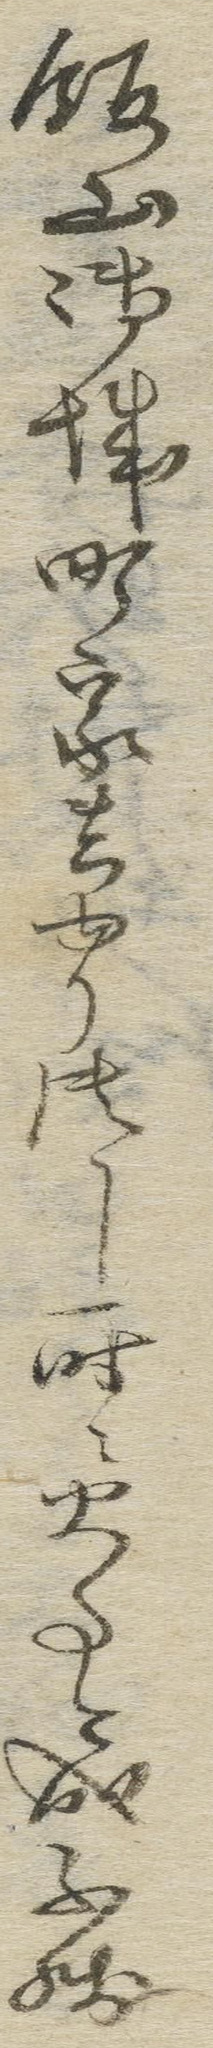飯山御城町家共ゆり潰し一時二火事と成不残
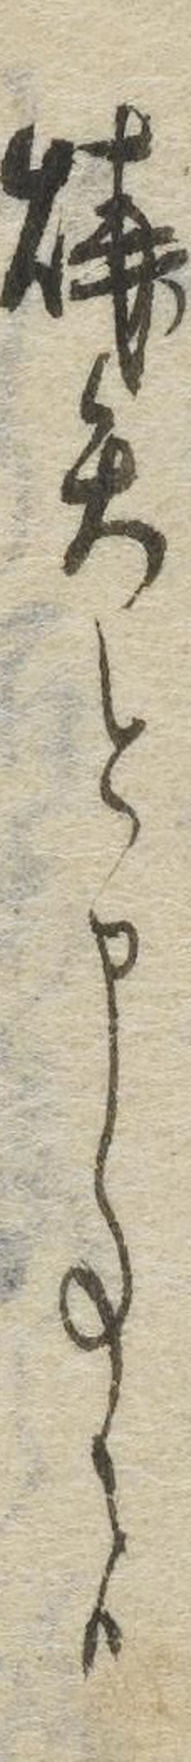焼失と申事候
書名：信濃越後　地震書留
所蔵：東京大学地震研究所図書室 Earthquake Research Institute Library, The University of Tokyo, JAPAN
